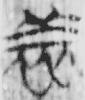羕
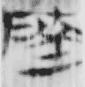陵
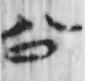公
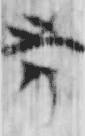之人
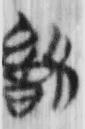○（胡）
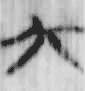大
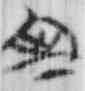室
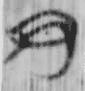尹
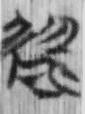溺
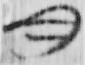月
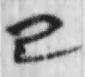己
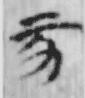亥
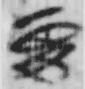妾
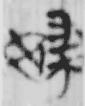婦
